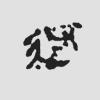返
